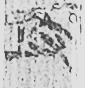攻
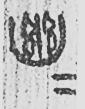幽=
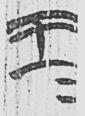王=
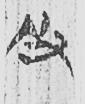及
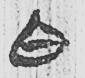白
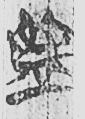盤
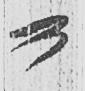乃
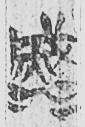滅
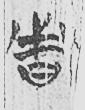周
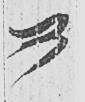乃
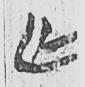亡
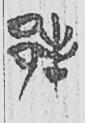邦
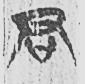君
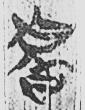者
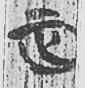正
